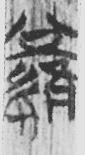羅
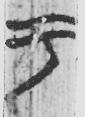于
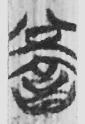{网享}
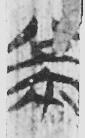{网尒}
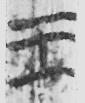王
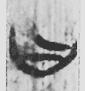曰
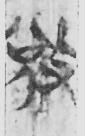敓（說）
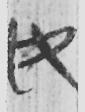女
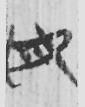母
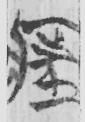{疒㞷}
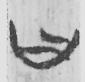曰
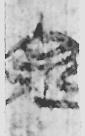余
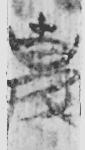尅
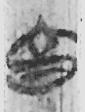亯
